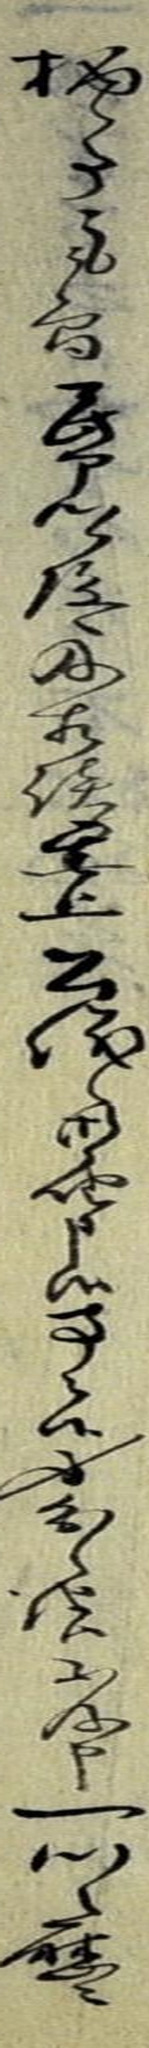柄之事にも候間民部卿殿へ及相談其上公儀へ御届申候事に候身分之儀は不及申一門之歴々
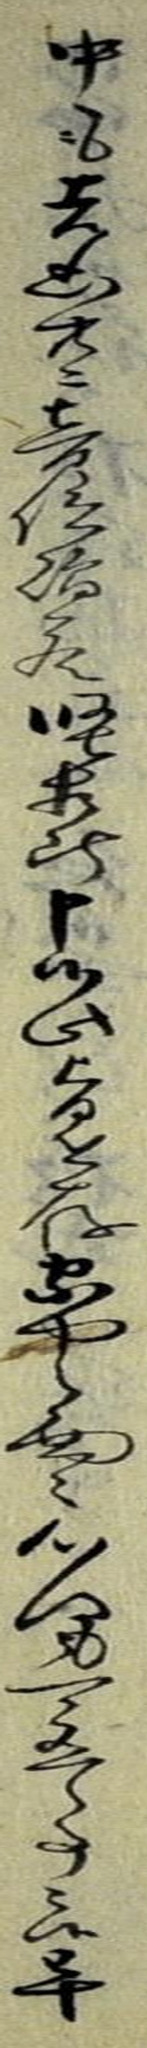中へも吉凶共に音信贈答堅相断申候此旨を存家中之面々心得も可有之事に候畢
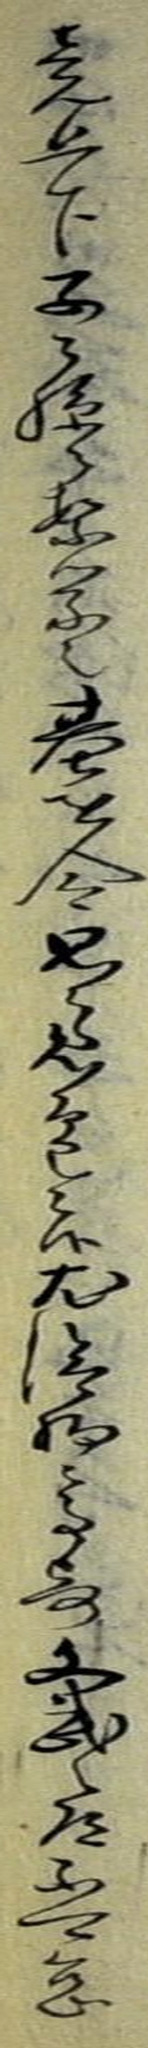竟上下子々孫々繁栄之基を令思慮而己に候尤倹約に事寄文武之道不可怠
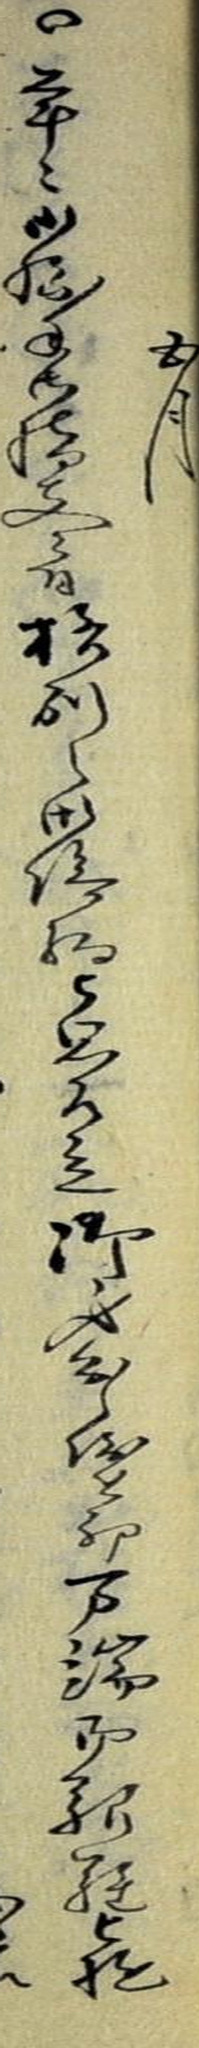〇年々御勝手御指支に付格別之御倹約被思召立御身分之儀を初万端御艱難被遊
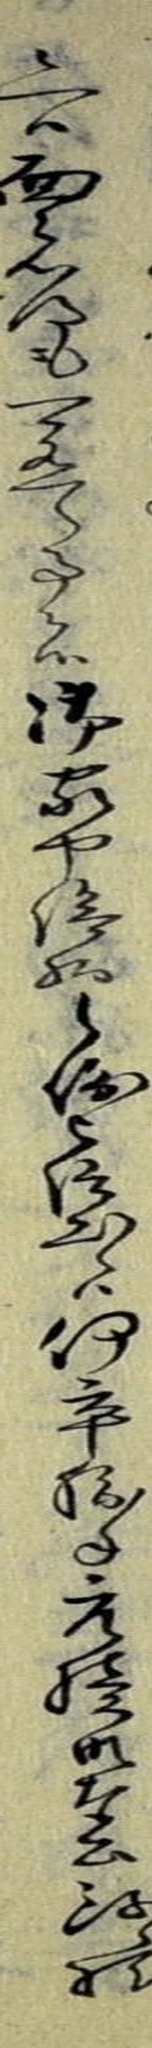候へは面々心得も可有之事に候御家中倹約之儀被仰出候は何卒勝手取続御奉公致候様
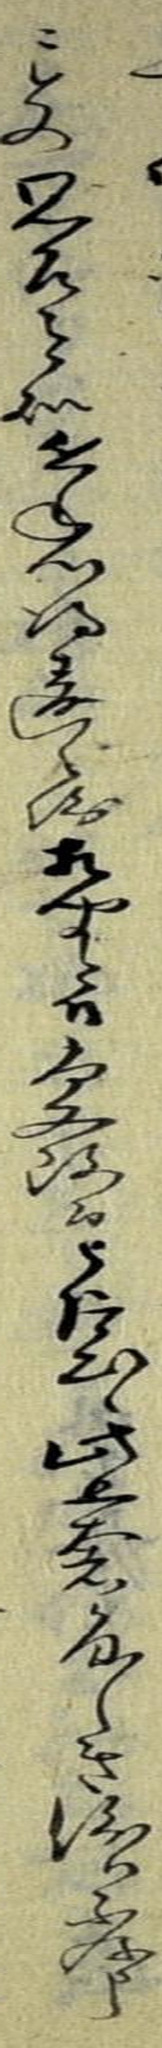にとの思召に候処近年心得違之儀相聞に付尚又改而被仰出候此上奢かましき儀は不及申
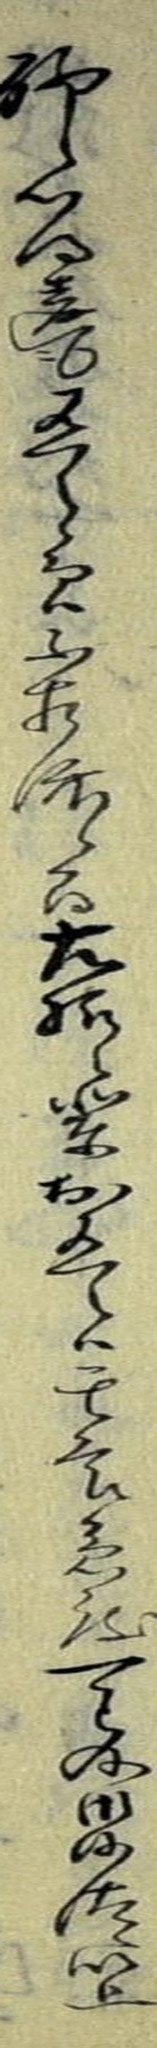聊之心得違も有之候而は不相済候間左様之輩於有之は其節急度可被及御沙汰候以上
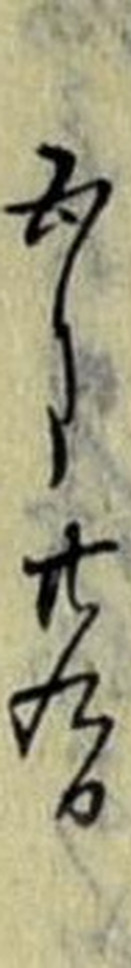五月廿九日
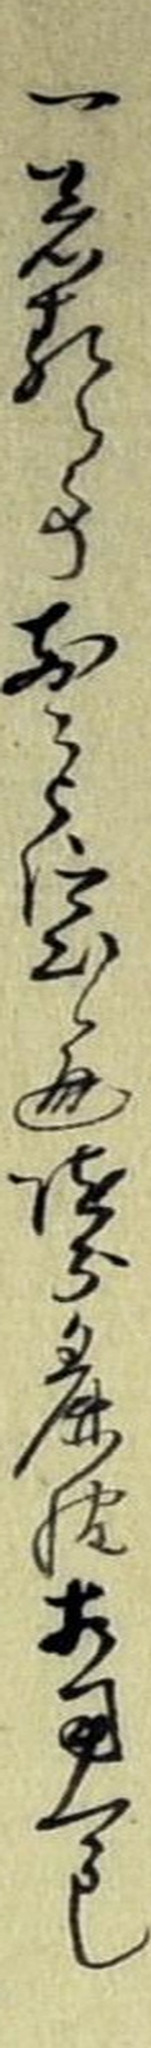一着類之事前々被仰出候通随分麁服相用可申候
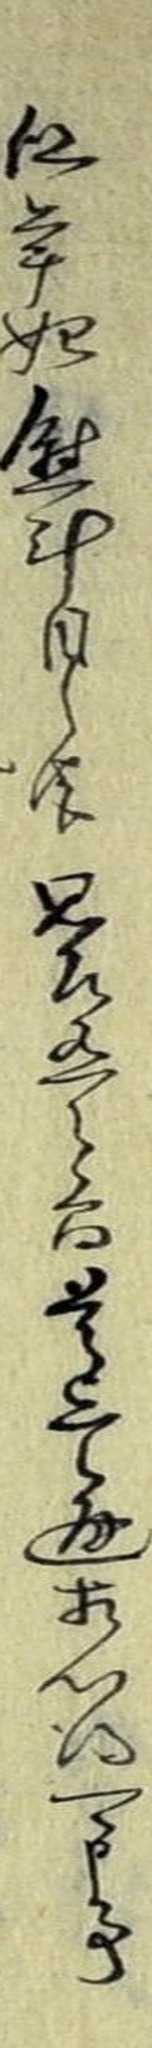但年始熨斗目之儀は思召有之候間是迄之通相心得可申事
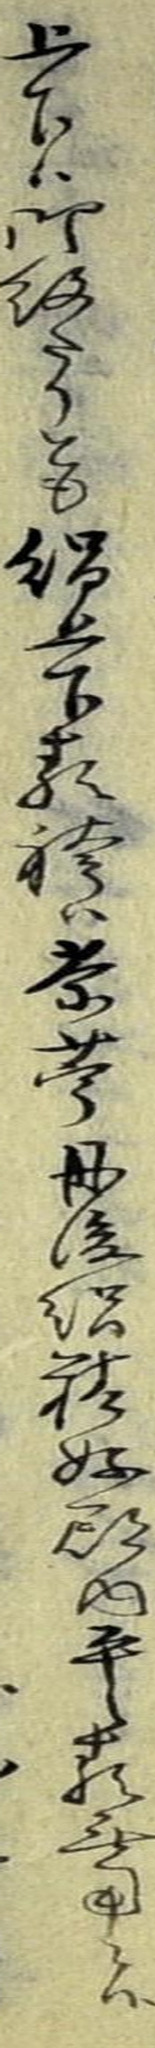一上下は御紋たりとも絹上下類袴は茶苧丹後絹精好郡内平之類無用に候
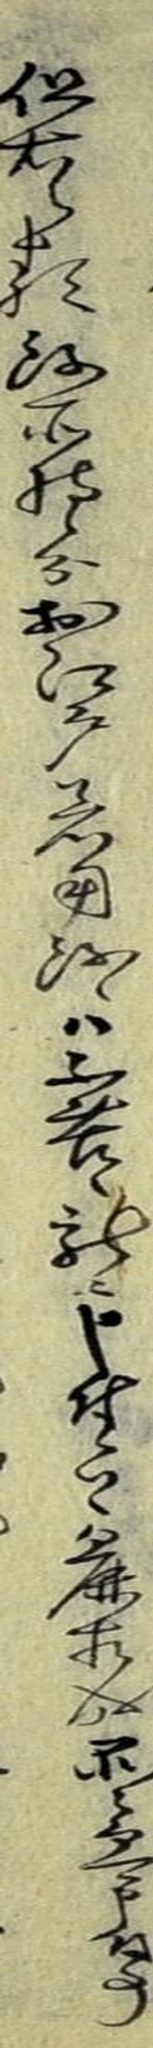但右之類致所持候分於江戸着用致候は不苦候新に申付候はゝ麁相成品に而可申付事
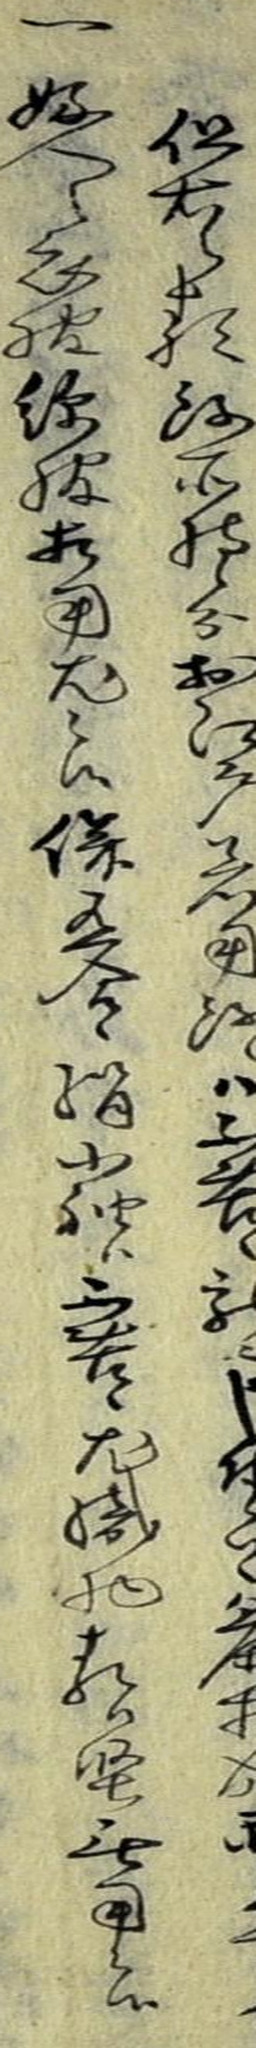一婦人之衣服綿服相用尤に候併有合候絹小袖は不苦候尤織物類は堅無用に候
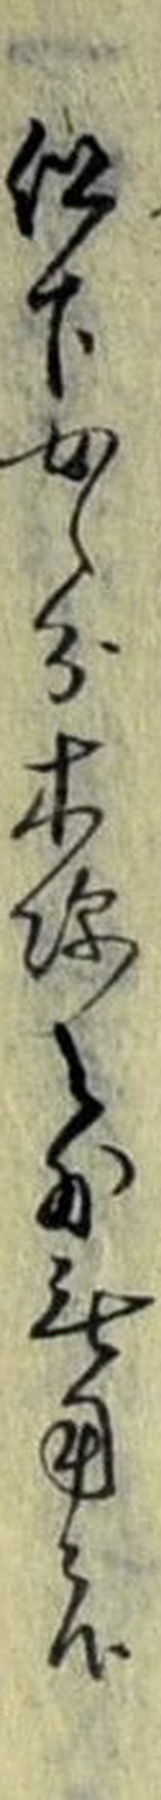但下女之分木綿之外無用に候
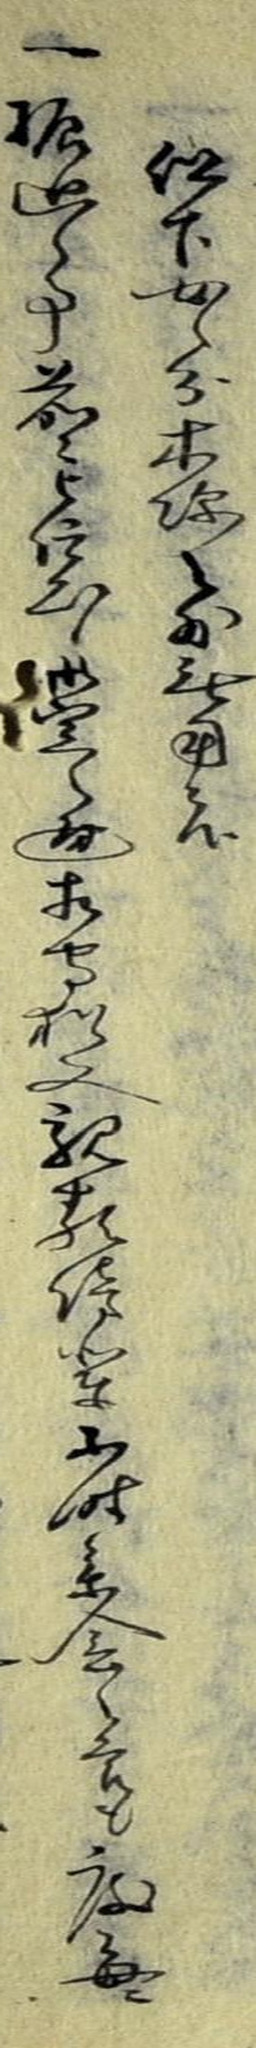一振廻之事前々被仰出候御定之通相守猶又親類傍輩不時参会之節も度毎に
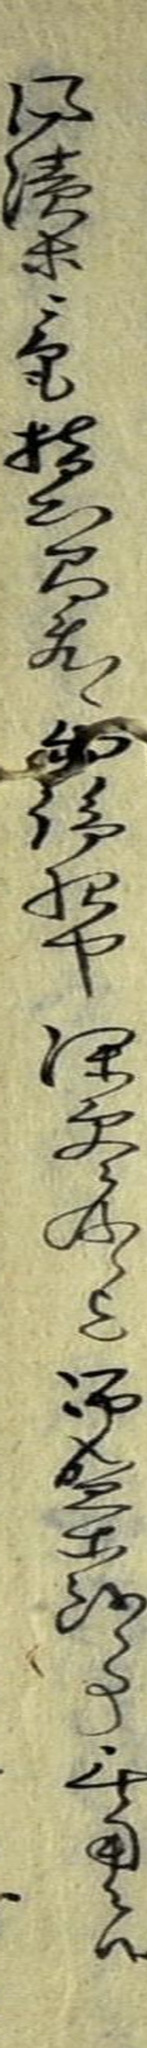湯漬等に而も指出間敷候勿論夜中深更に及候迄酒盛等致候事無用に候
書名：命令之部 二
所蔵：福井県文書館 Fukui Prefectural Archives
